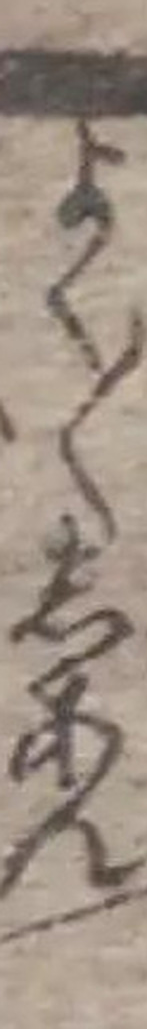よく〳〵しあん
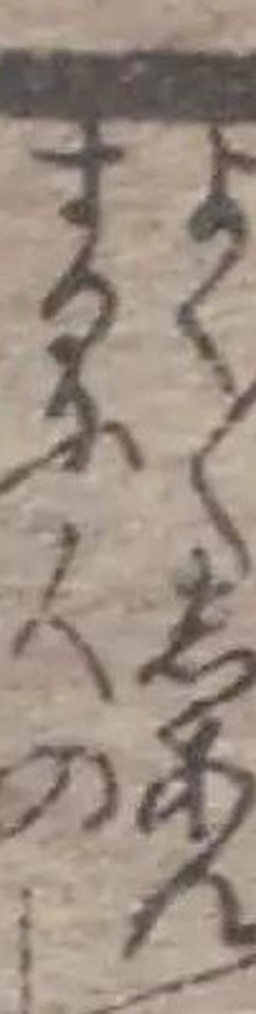するに人の
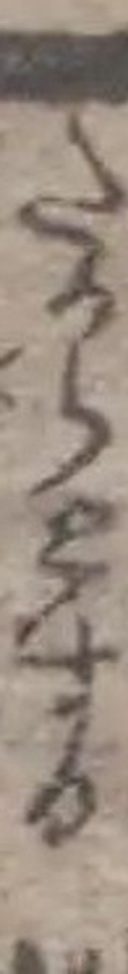たからとする
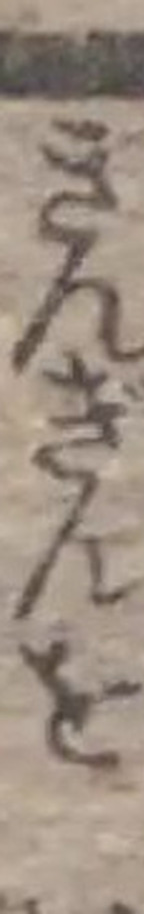きんぎんを
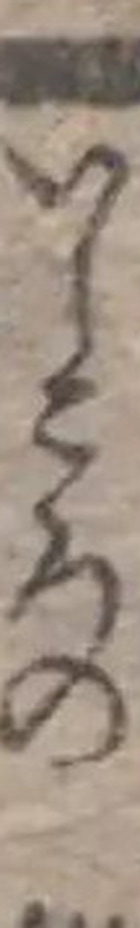いしころの
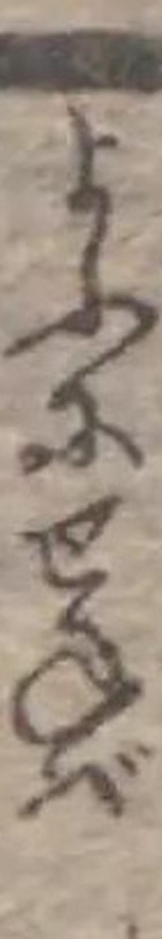よふにせねば
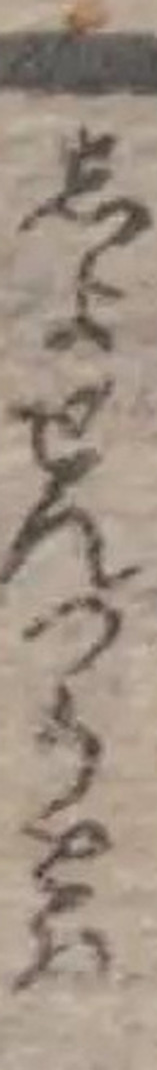しよせんつうとは
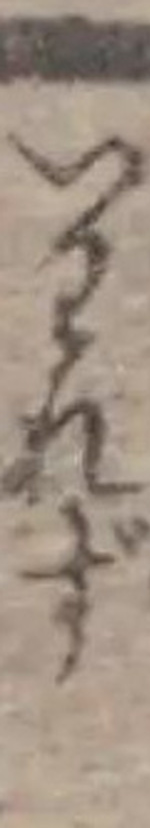いわれず
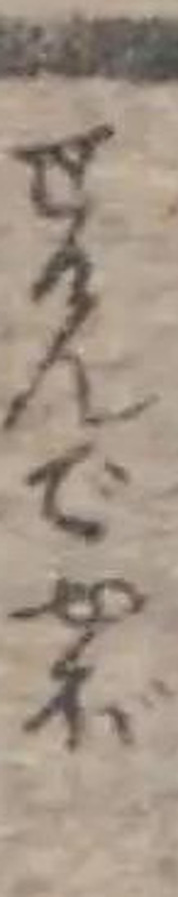せけんでやぼ
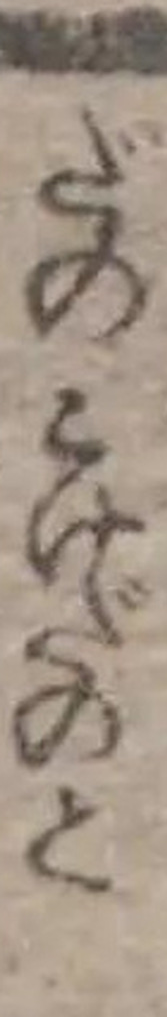だのこけだのと
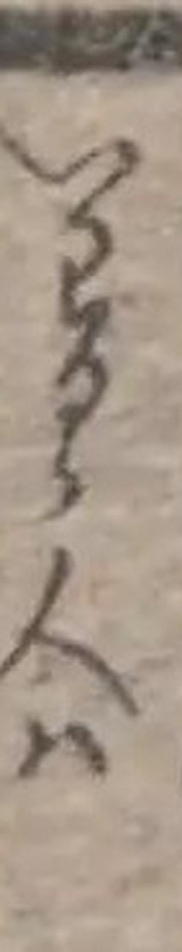いわるゝ人は
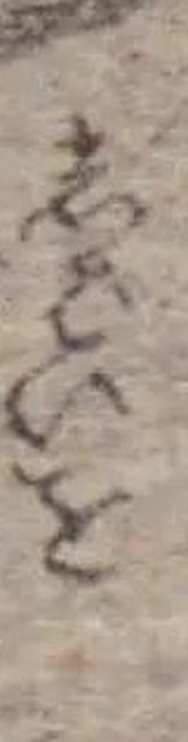しはいを
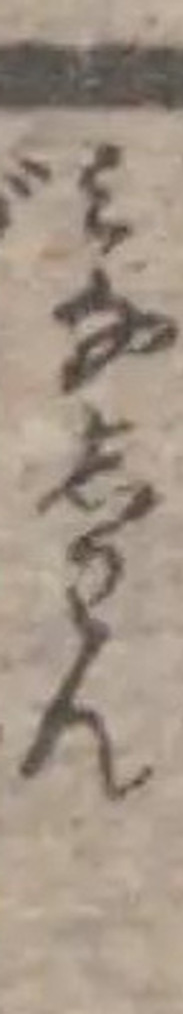みなしわん
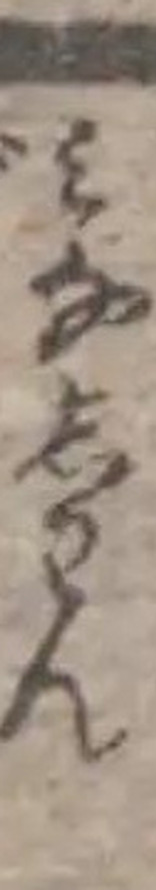みなしわん
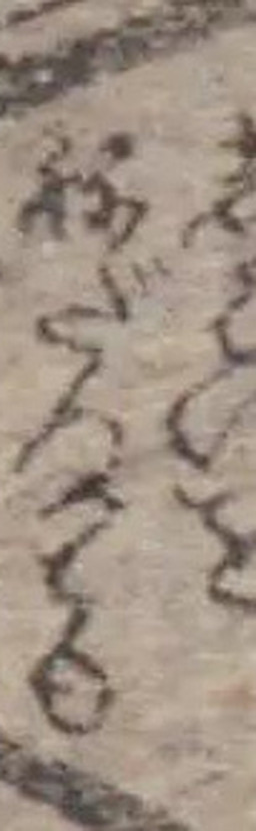ねだるとも
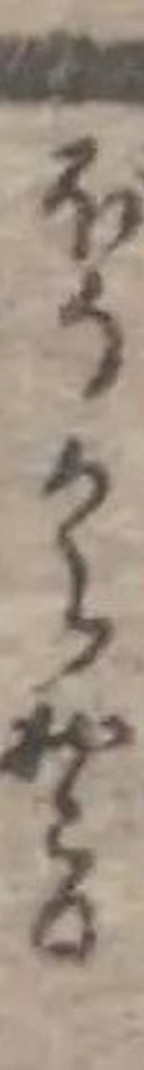ぼうからおこる
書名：富多高慢噺 3巻
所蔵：国立国会図書館 National Diet Library, JAPAN
